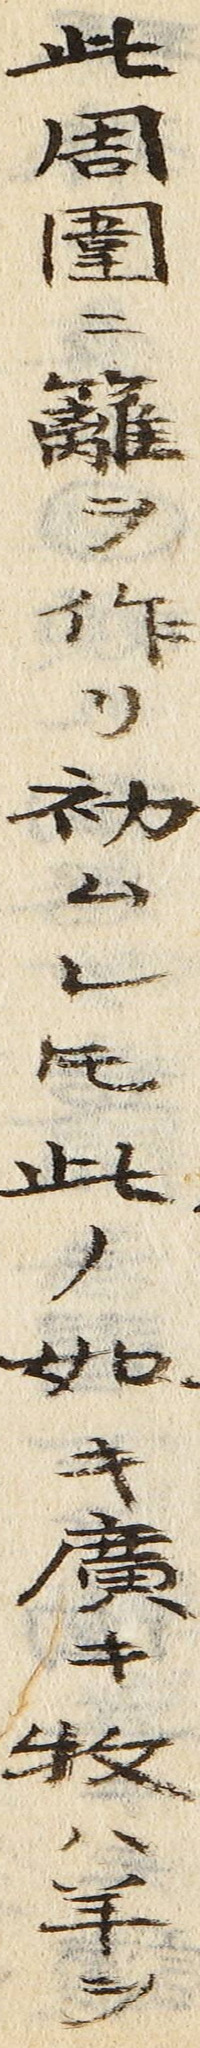此周囲ニ籬ヲ作リ初ムレトモ此ノ如キ広キ牧ハ羊ヲ
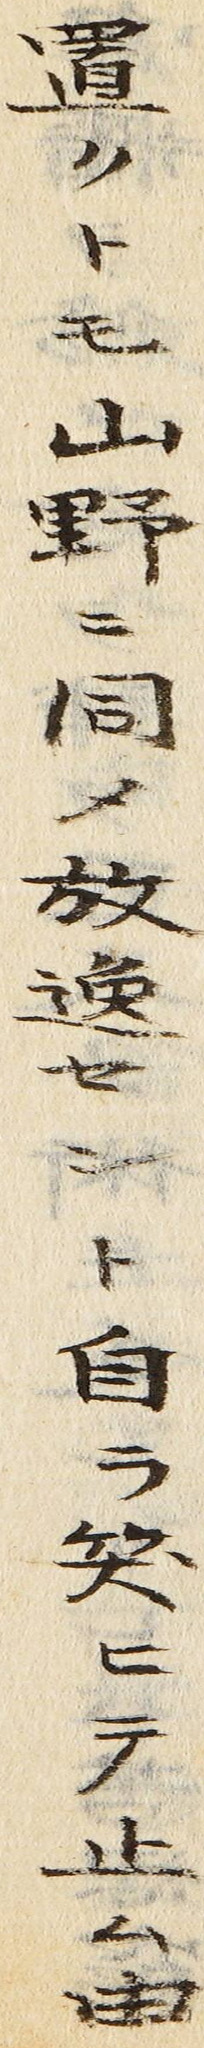置クトモ山野ニ同シテ放逸セント自ラ笑ヒテ止ム由
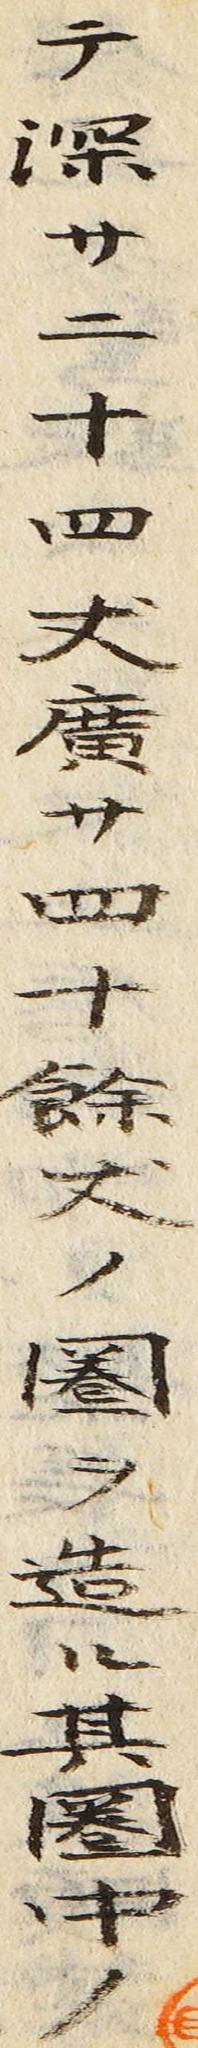テ深サ二十四丈広サ四十余丈ノ圏ヲ造ル其圏中ノ
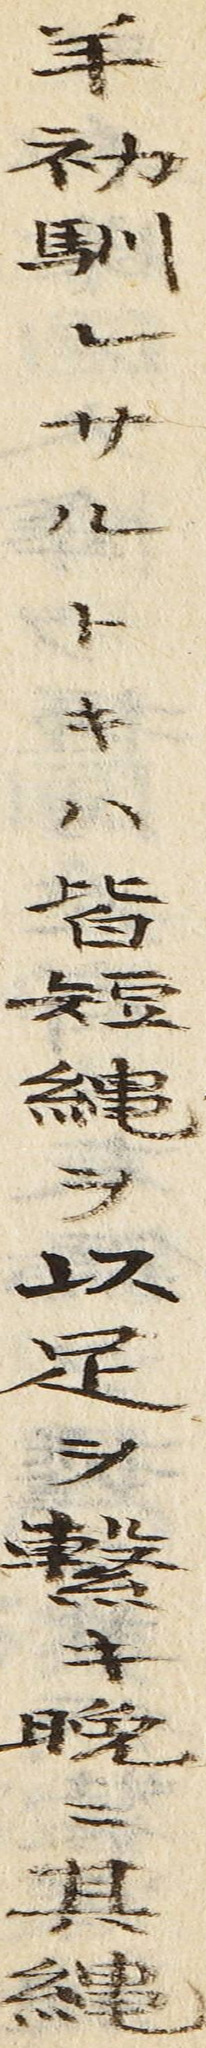羊初馴レサルトキハ皆短縄ヲ以足ヲ繋キ晩ニ其縄
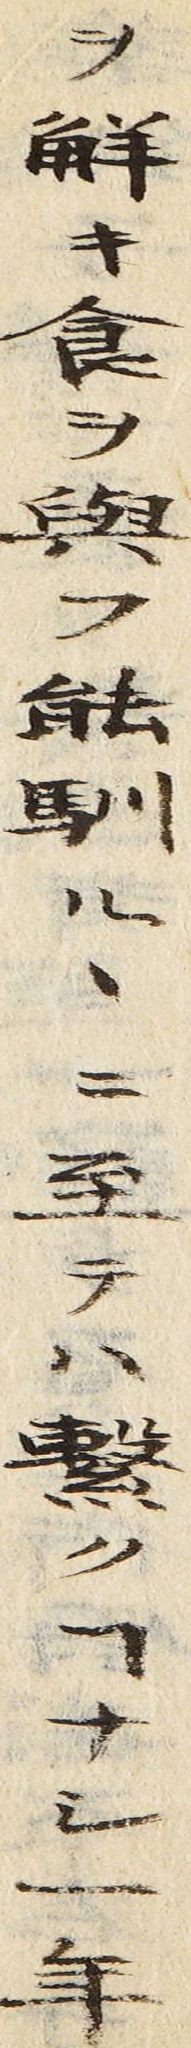ヲ解キ食ヲ与フ能馴ルヽニ至テハ繋クコトナシ一年
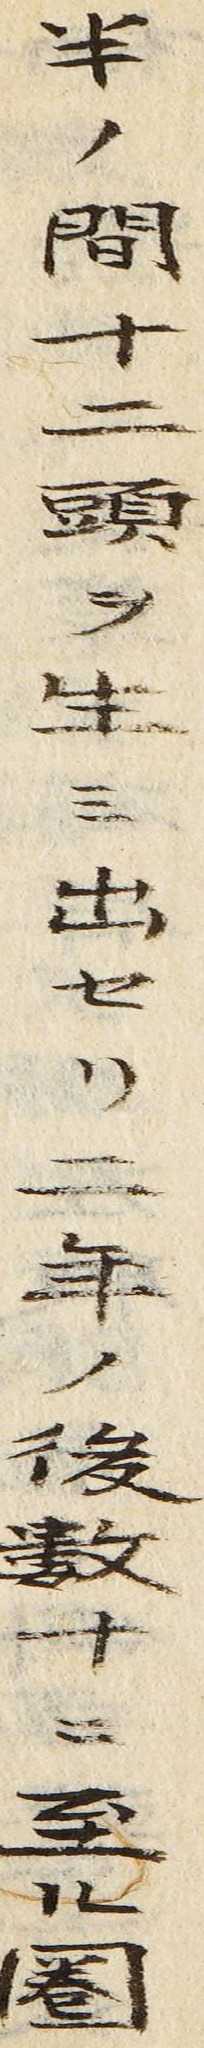半ノ間十二頭ヲ生ミ出セリ二年ノ後数十ニ至ル圏
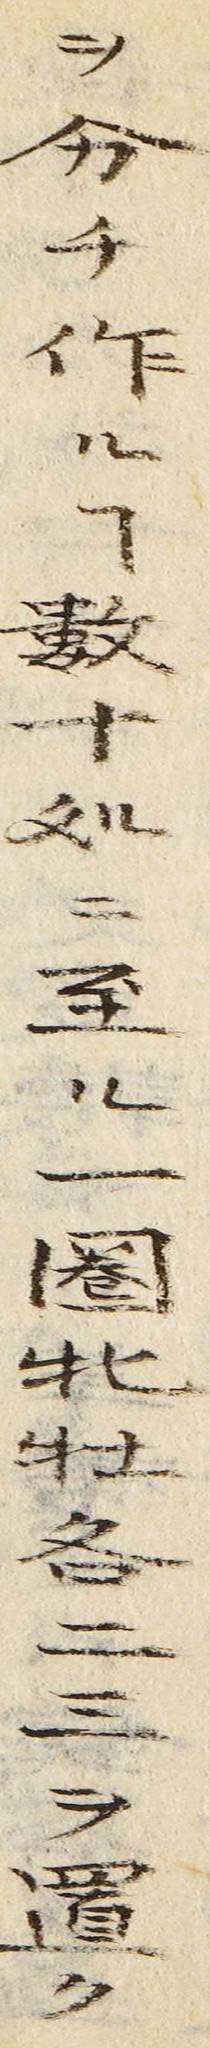ヲ分チ作ルコト数十処ニ至ル一圏牝牡各二三ヲ置ク
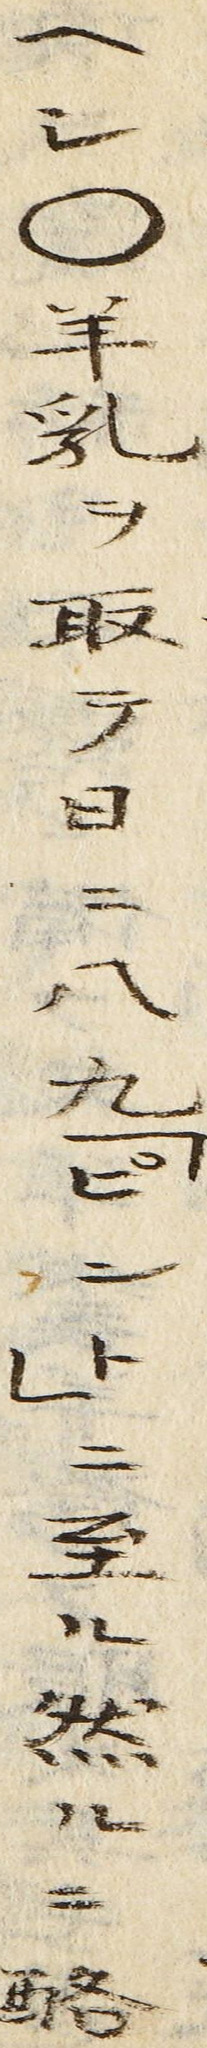ヘシ◯羊乳ヲ取テ日ニ八九「ピント」ニ至ル然ルニ酪
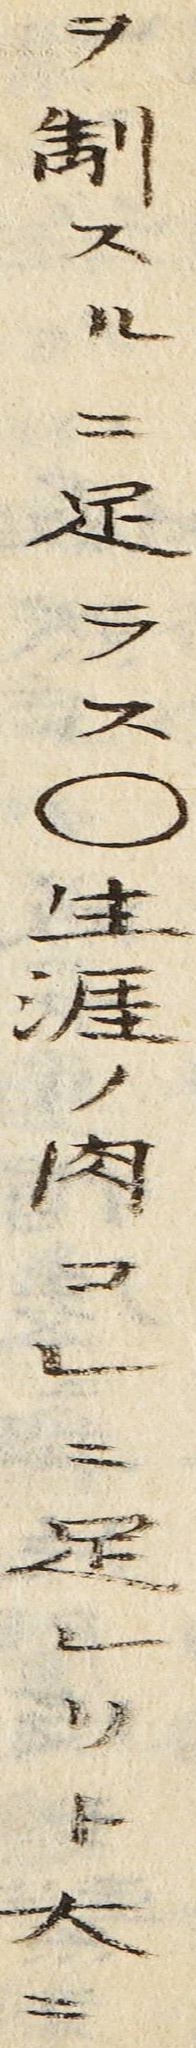ヲ制スルニ足ラス◯生涯ノ肉コレニ足レリト大ニ
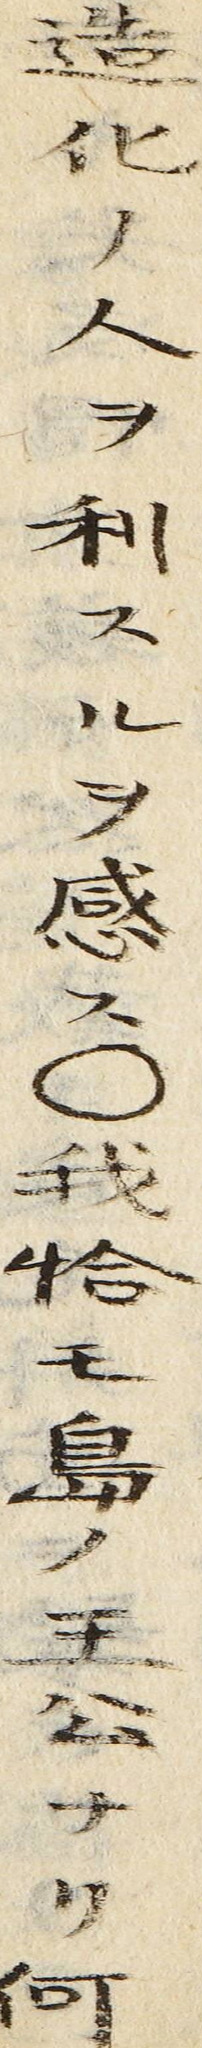造化ノ人ヲ利スルヲ感ス◯我恰モ島ノ王公ナリ何
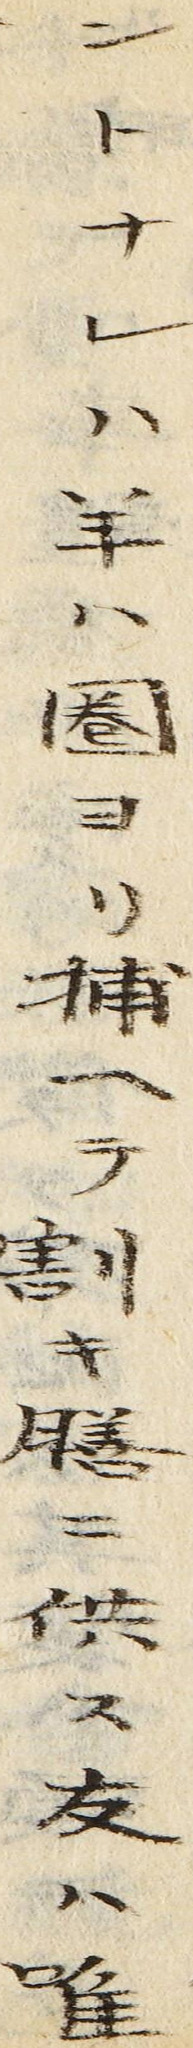ントナレハ羊ハ圏ヨリ捕ヘテ割キ膳ニ供ス友ハ唯
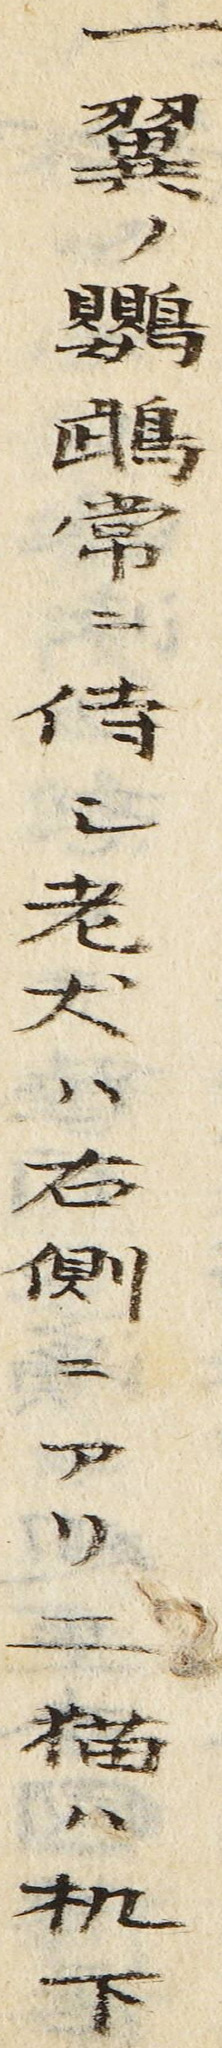一翼ノ鸚鵡常ニ待シ老犬ハ右側ニアリ二猫ハ机下
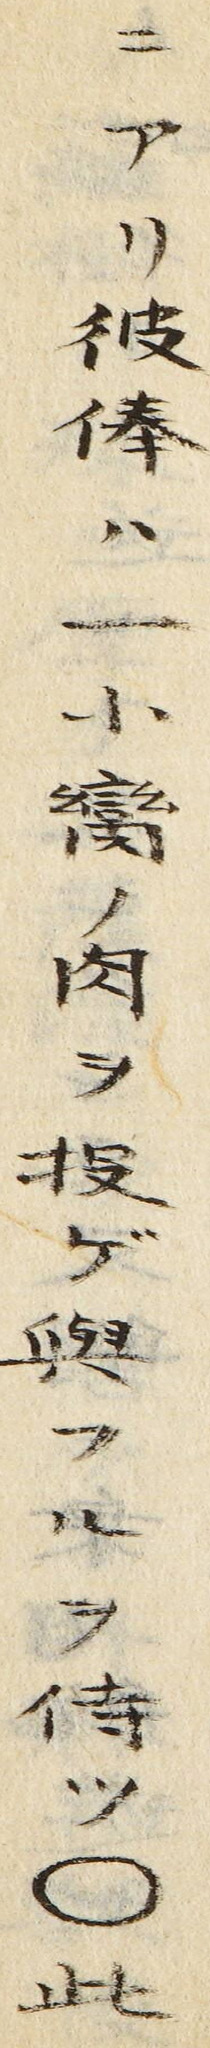ニアリ彼俸ハ一小臠ノ肉ヲ投ゲ与フルヲ待ツ◯此

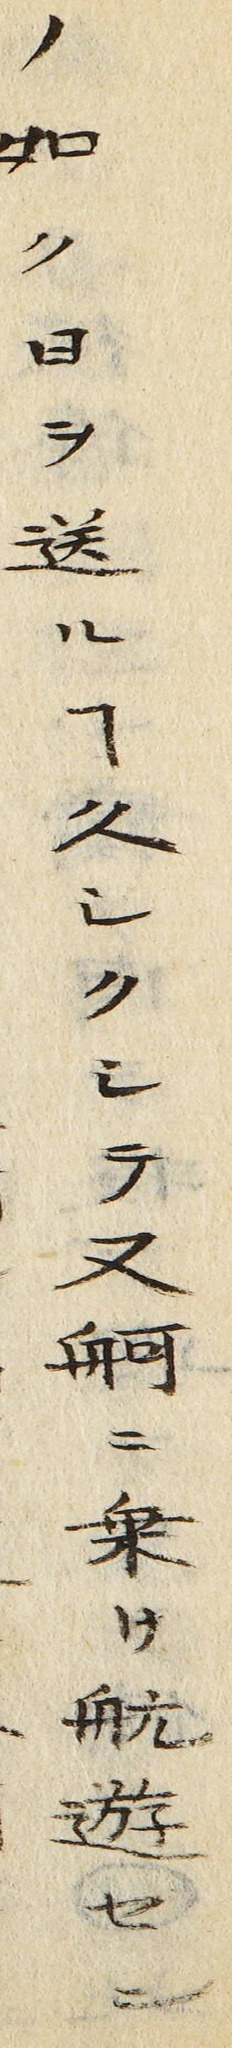ノ如ク日ヲ送ルコト久シクシテ又舸ニ乗リ航遊セン
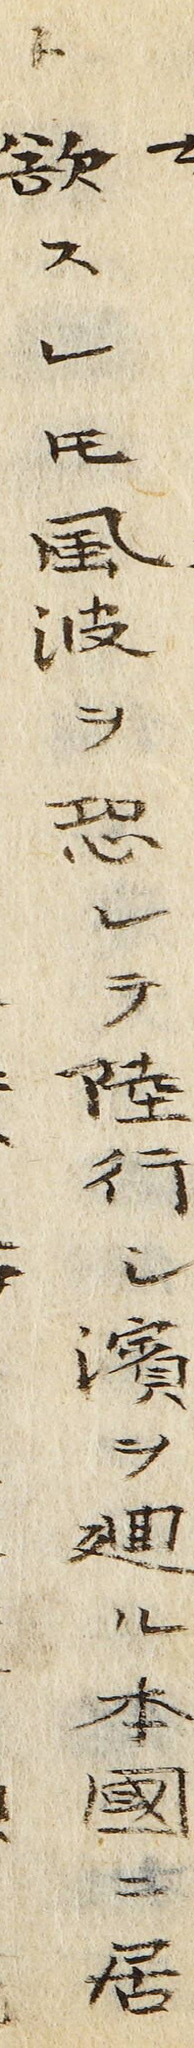ト欲スレトモ風波ヲ恐レテ陸行シ浜ヲ廻ル本国ニ居
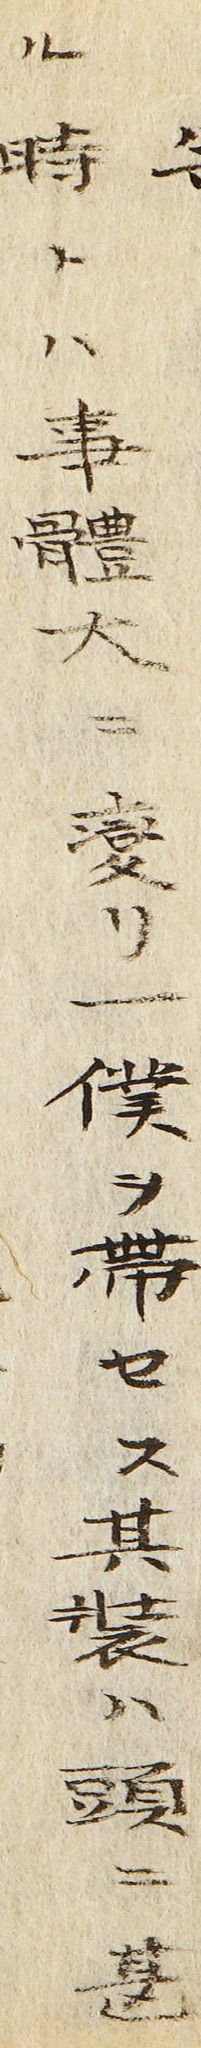ル時トハ事体大ニ変リ一僕ヲ帯セス其装ハ頭ニ甚
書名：漂流紀事
